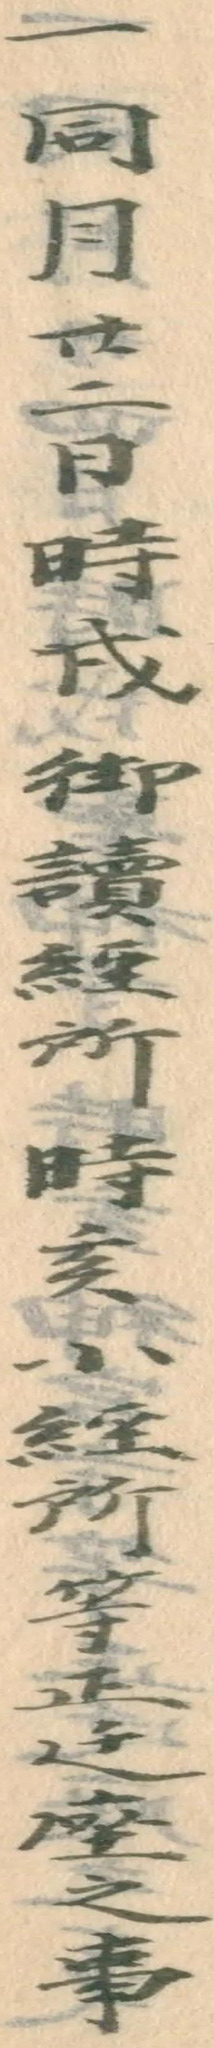一同月廿二日時戌御読経所時亥小経所等正迁座之事

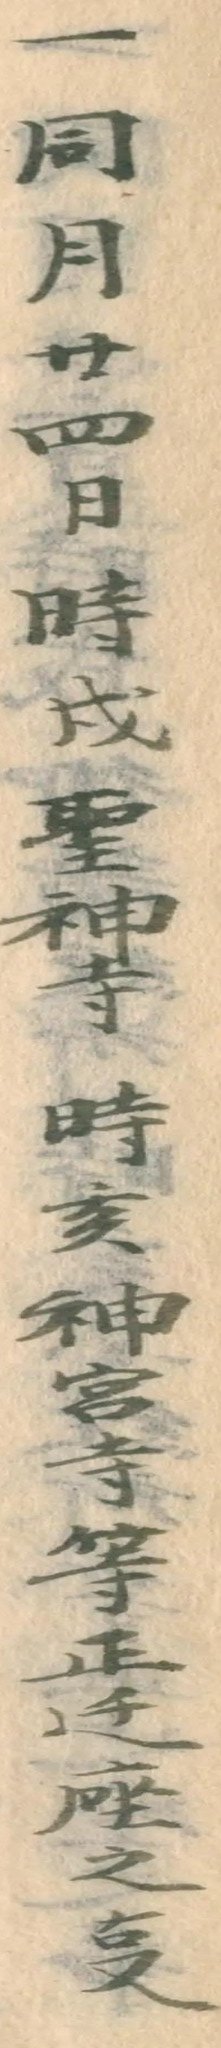一同月廿四日時戌聖神寺時亥神宮寺等正迁座之事
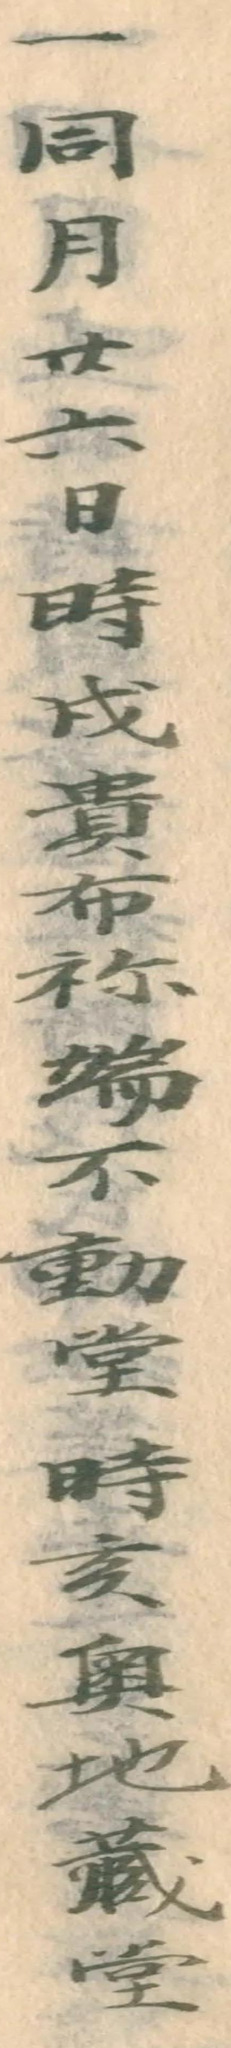一同月廿六日時戌貴布祢端不動堂時亥奥地蔵堂
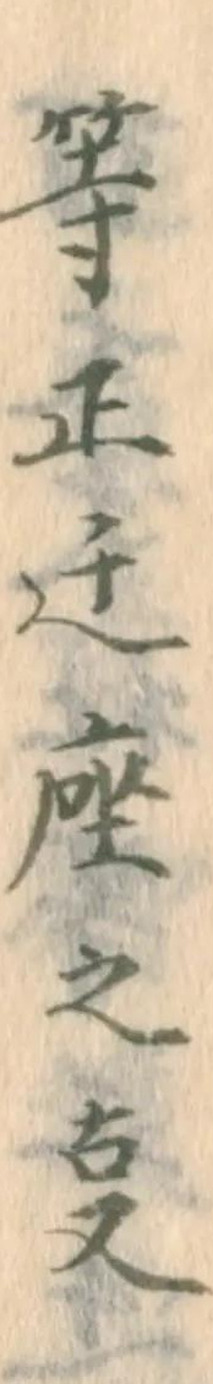等正迁座之事
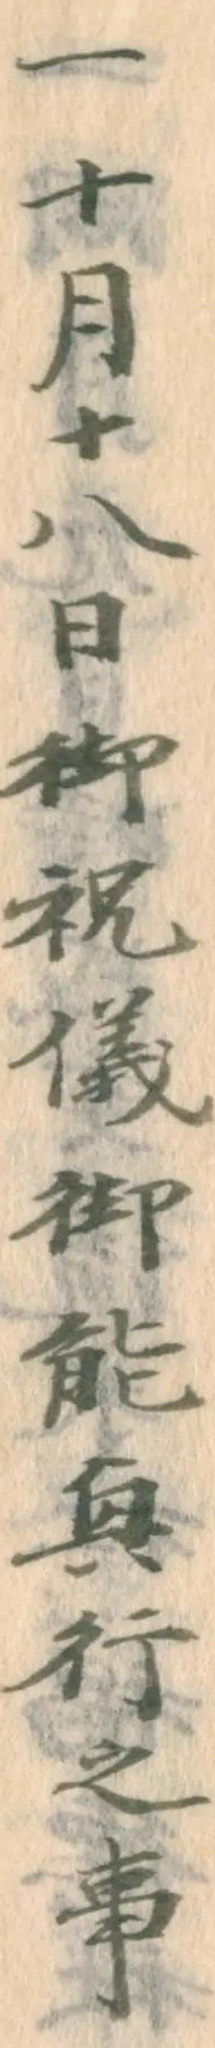一十月十八日御祝儀御能興行之事
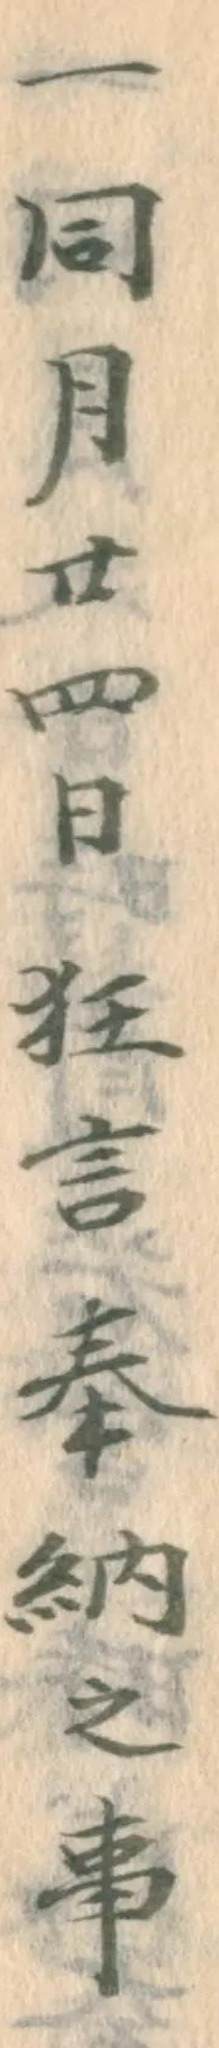一同月廿四日狂言奉納之事
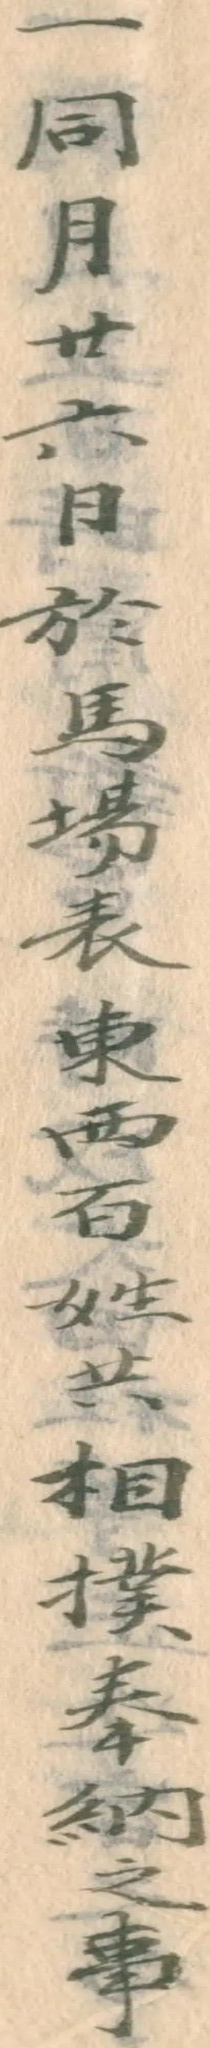一同月廿六日於馬場表東西百姓共相撲奉納之事
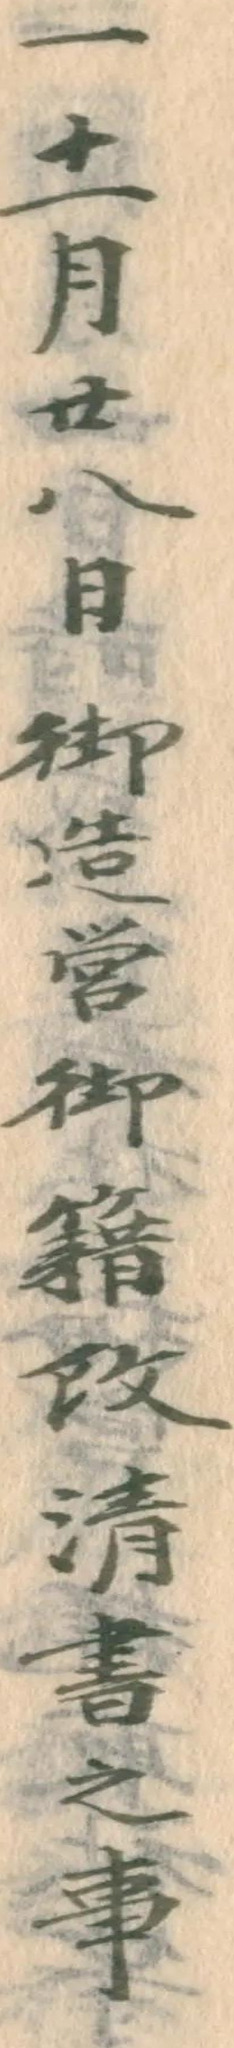一十一月廿八日御造営御籍改清書之事
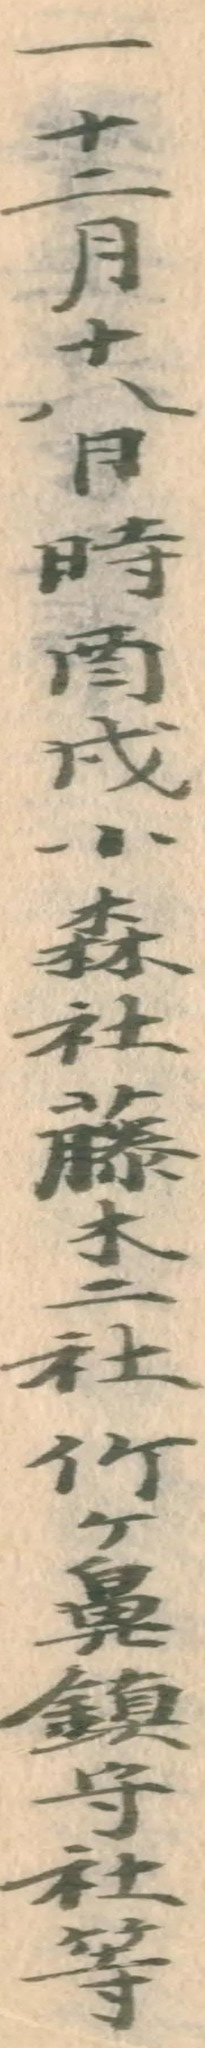一十二月十八日時酉戌小森社藤木二社竹ケ鼻鎮守社等
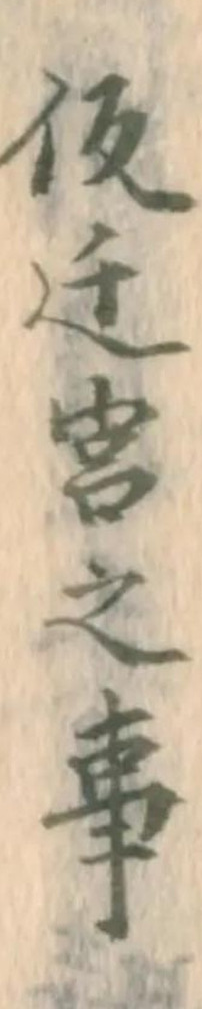仮迁宮之事

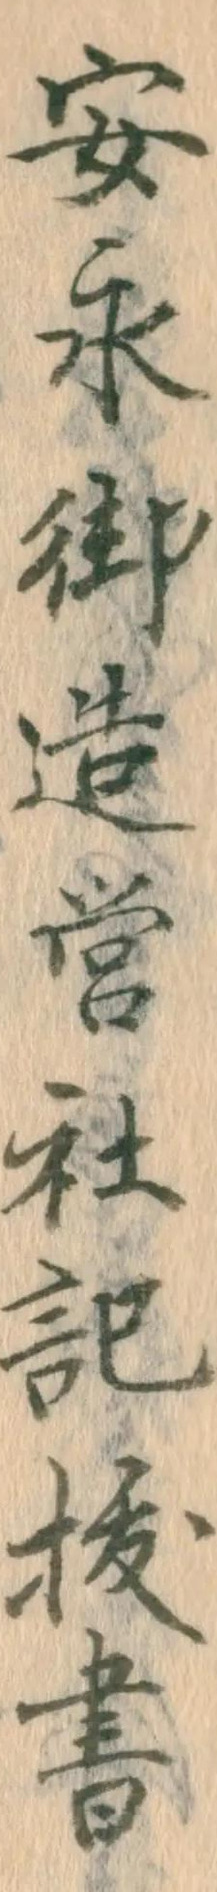安永御造営社記抜書
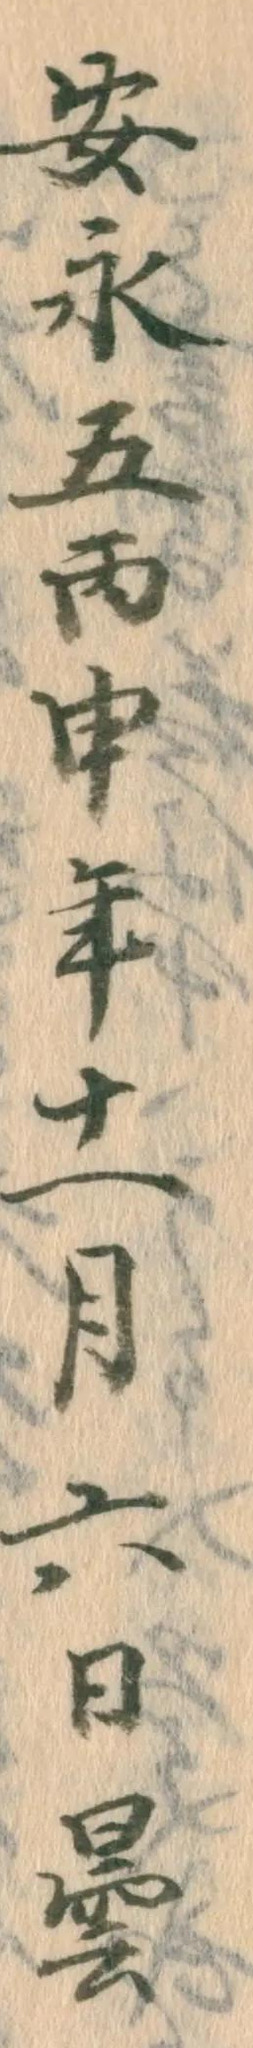安永五丙申年十一月六日曇
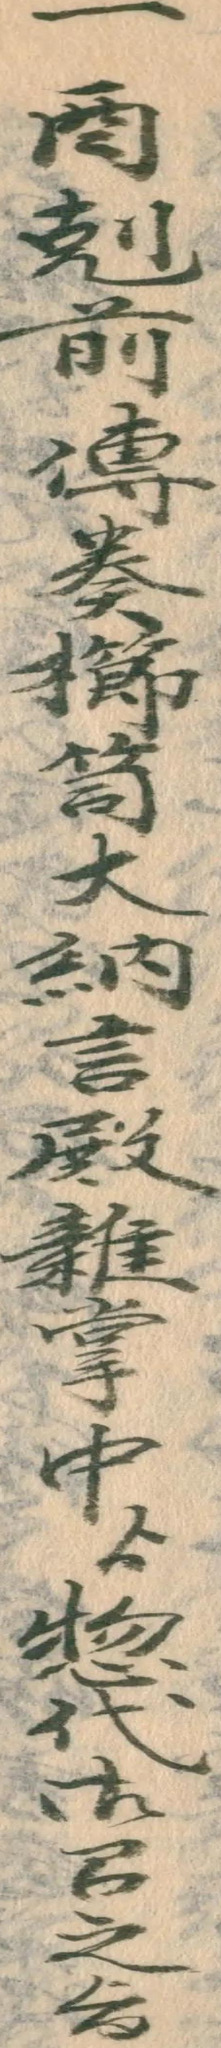一酉剋前伝奏櫛笥大納言殿雑掌中ゟ惣代御召之旨
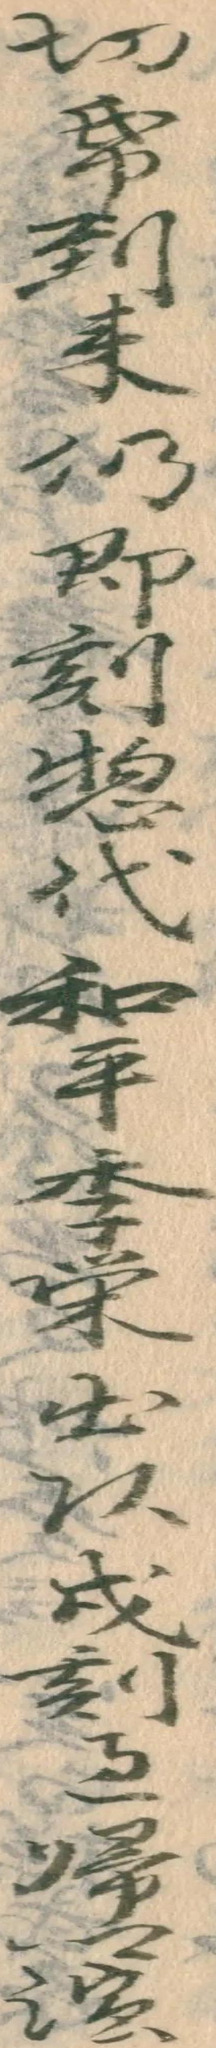切帋到来仍即刻惣代和平李栄出頭戌刻過帰郷演
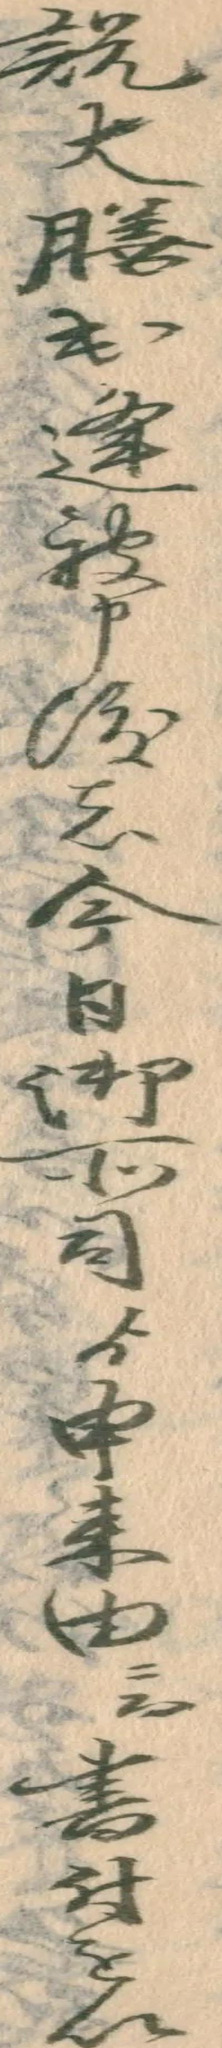説大膳出逢被申渡は今日御所司ゟ申来由ニ而書付を以
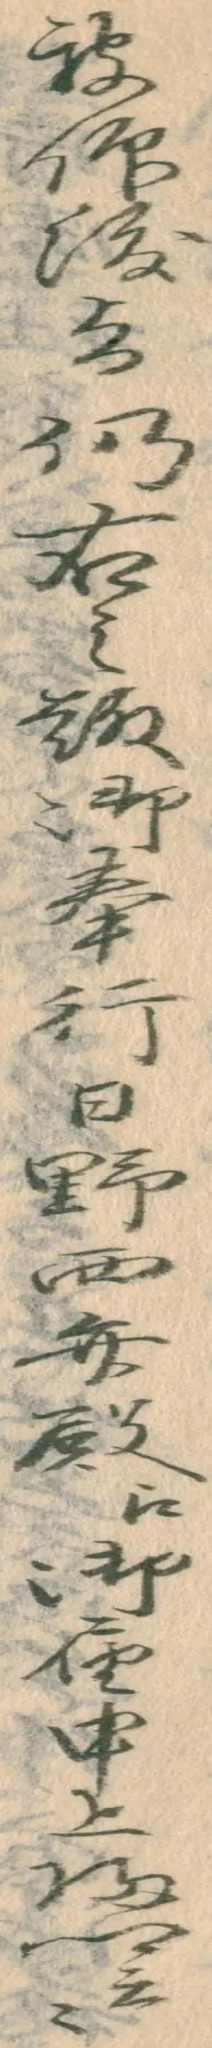被仰渡旨仍右之趣御奉行日野西弁殿江御届申上帰郷云々
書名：賀茂社記録. 第17冊
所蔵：国立国会図書館 National Diet Library, JAPAN
